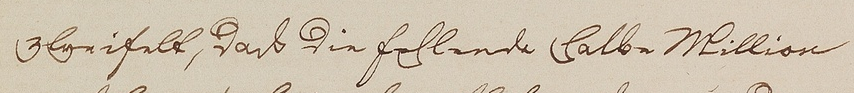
zweifelt, daß die fehlende halbe Million
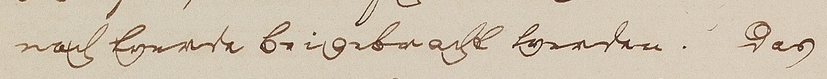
noch werde beigebracht werden. Das
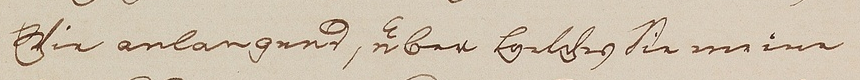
Wie anlangend, über welches Sie meine
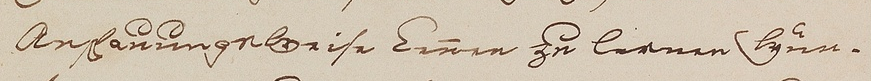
Anschauungsweise kennen zu lernen wün-
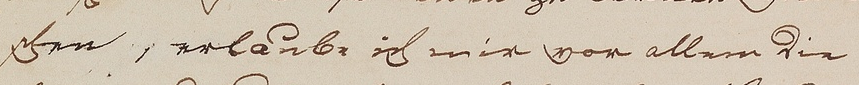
schen, erlaube ich mir vor allem die
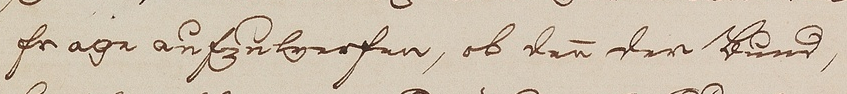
Frage aufzuwerfen, ob denn der Bund,
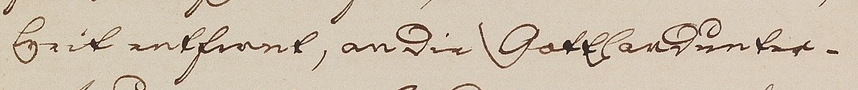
weit entfernt, an die Gotthardunter-
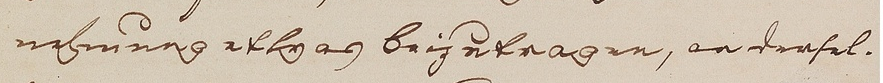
nehmung etwas beizutragen, an dersel-
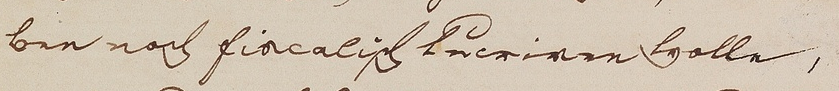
ben noch fiscalisch lucriren wolle,
